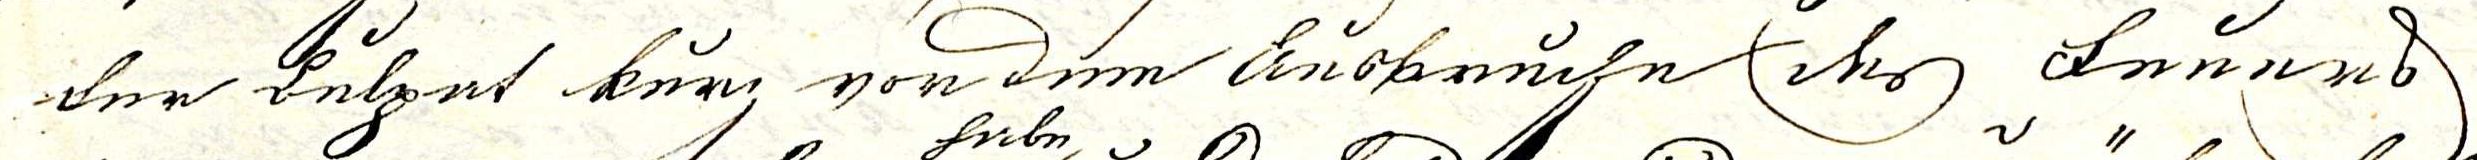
der Culpat kurz vor dem Ausbruche des Feuers
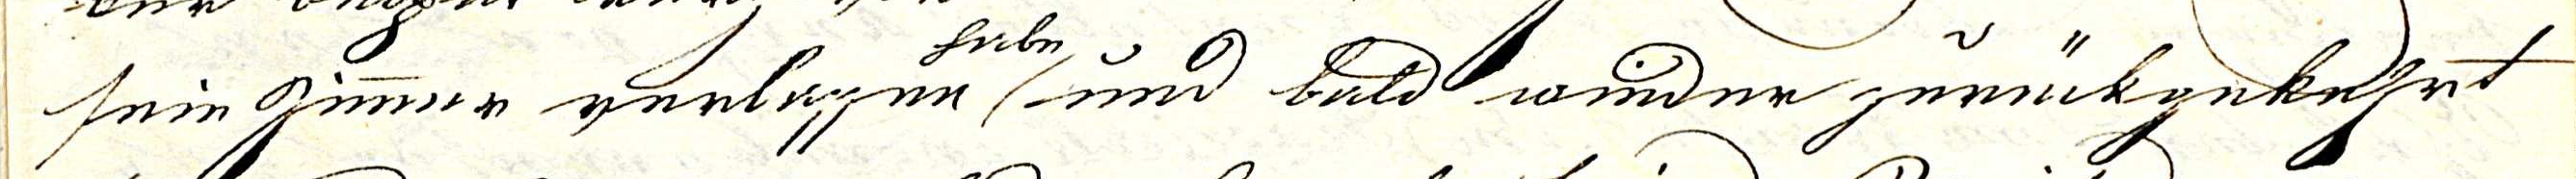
sein Zimmer verlassen habe und bald wieder zurückgekehrt
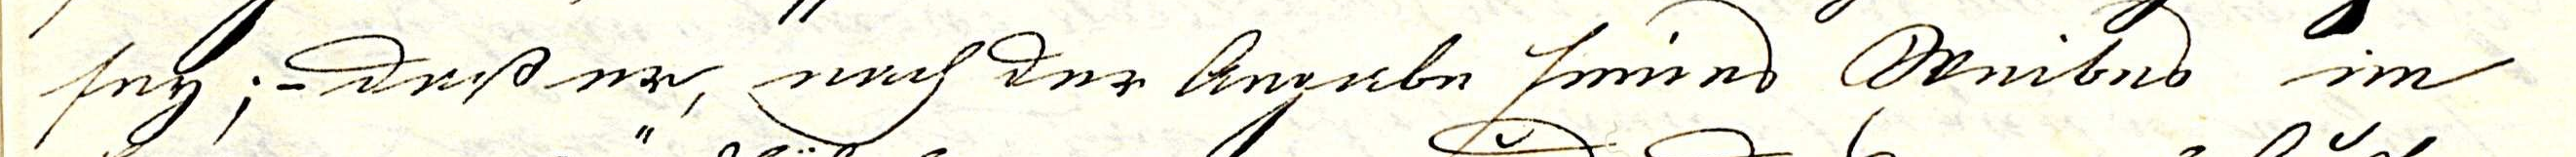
sey; -- daß er, nach der Angabe seines Weibes im
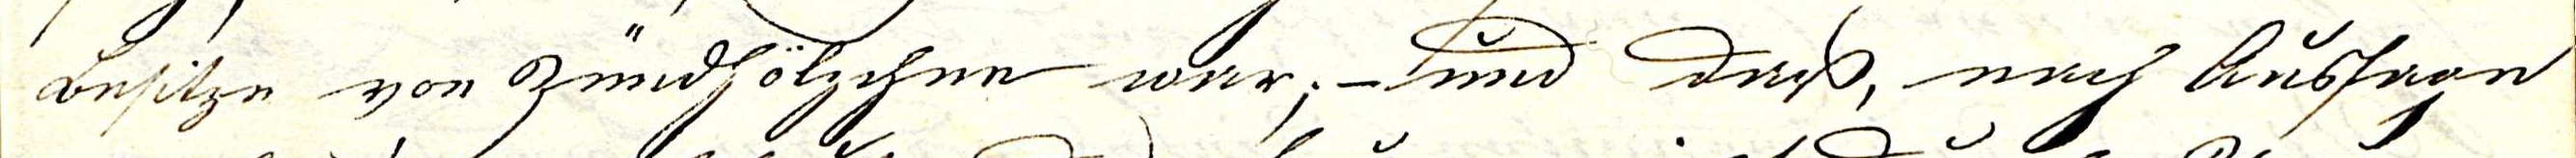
Besitze von Zündhölzchen war; -- und daß, nach Aussage
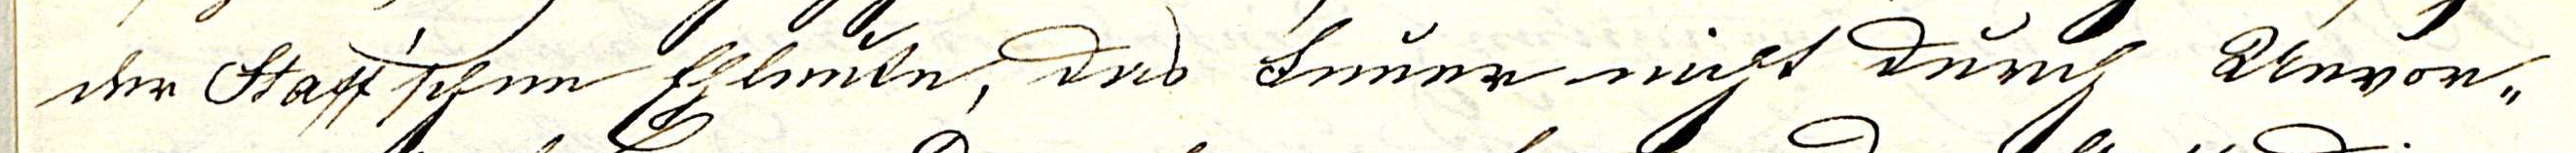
der Staff’schen Eheleute, das Feuer nicht durch Unvor¬
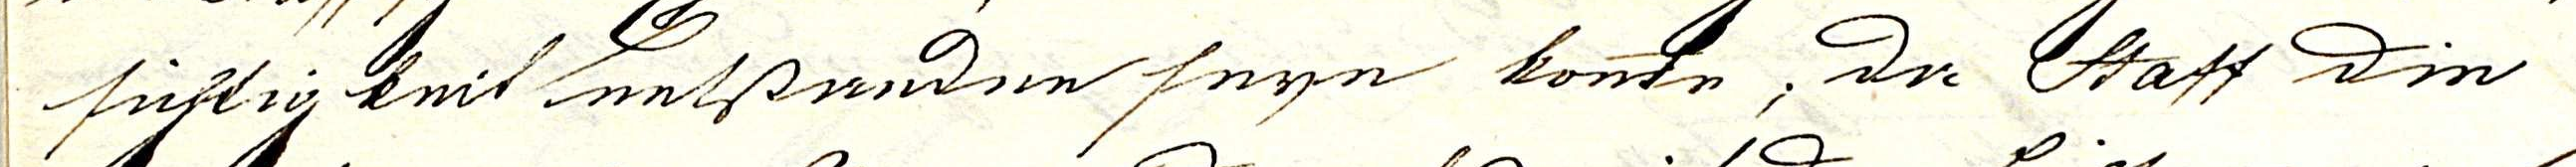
sichtigkeit entsenden seyn konnte; da Staff die
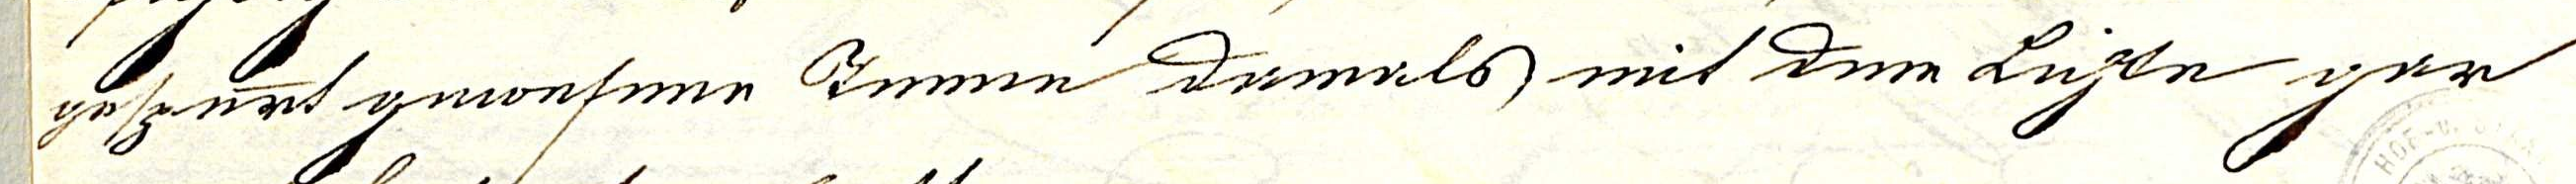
gesperrt gewesene Tenne damals mit dem Lichte gar
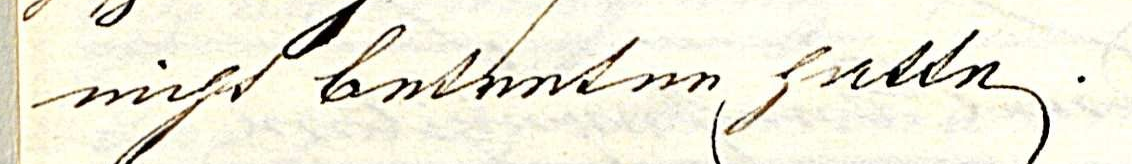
nicht betreten hatte.
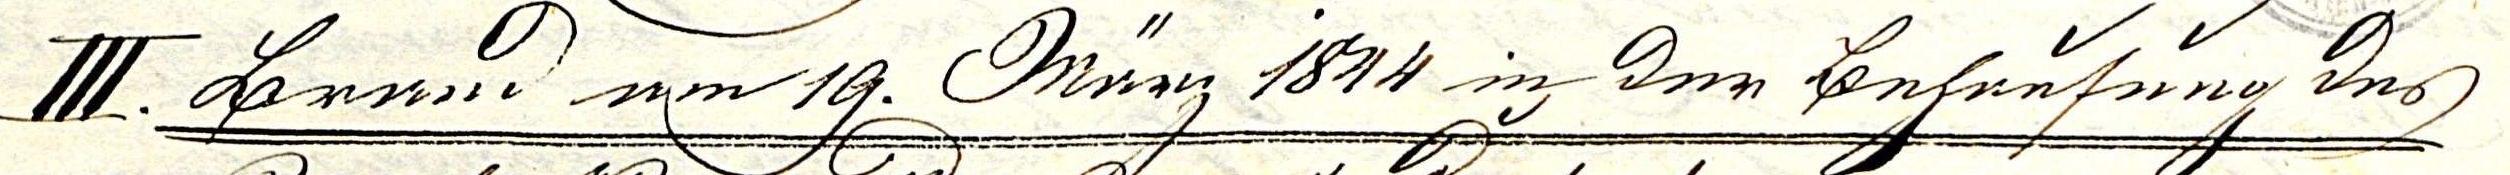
III. Brand am 19. März 1844 in der Behausung des
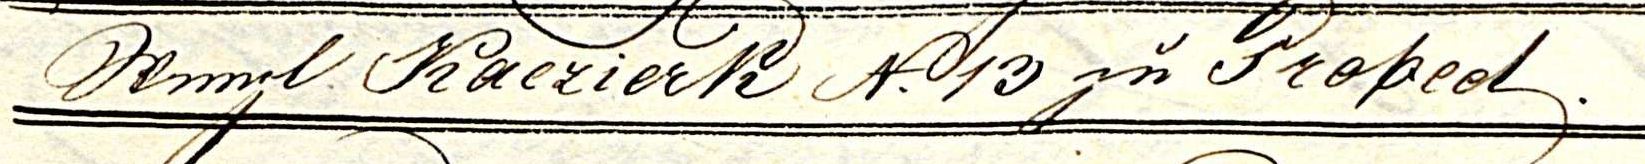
Wenzl Kaczierk N. 13 zu Proped
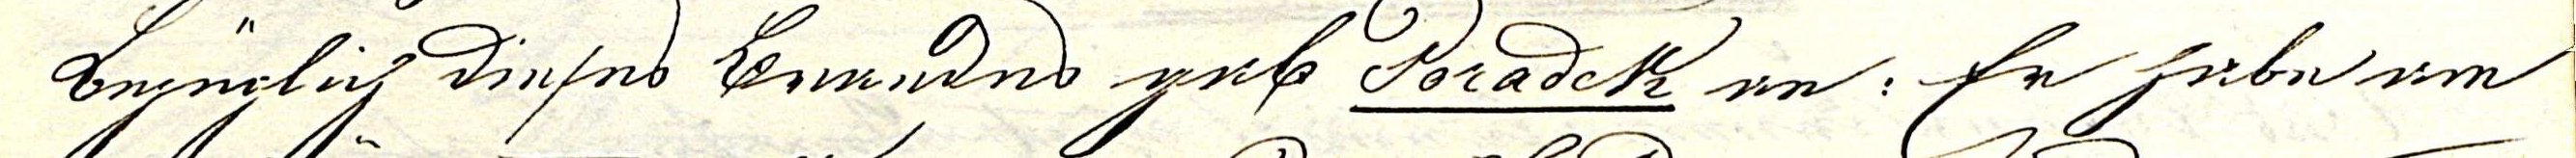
Bezüglich dieses Brandes gab Poradek an: Er habe am
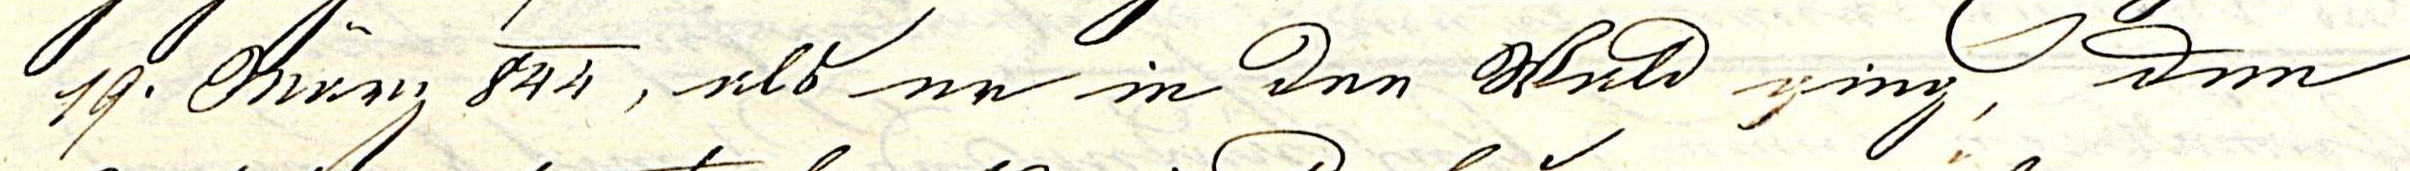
19. März 1844, als er in den Wald ging, den
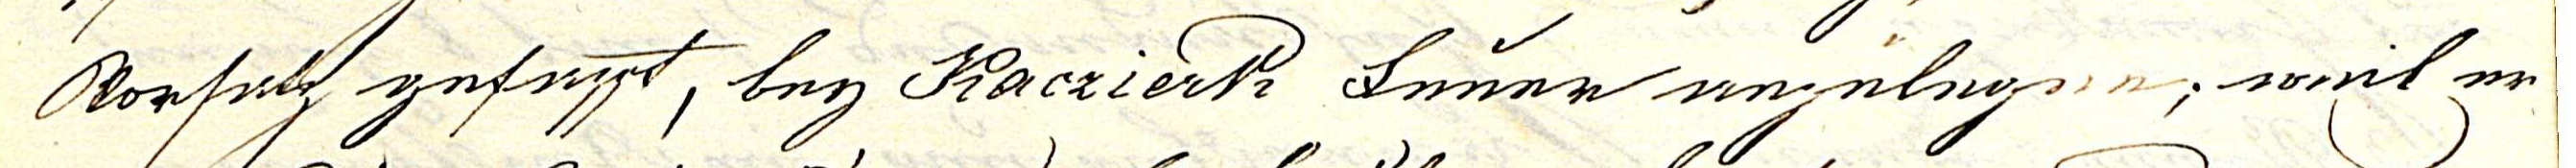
Vorsatz gefasst, bey Kaczierk Feuer anzulegen; weil er
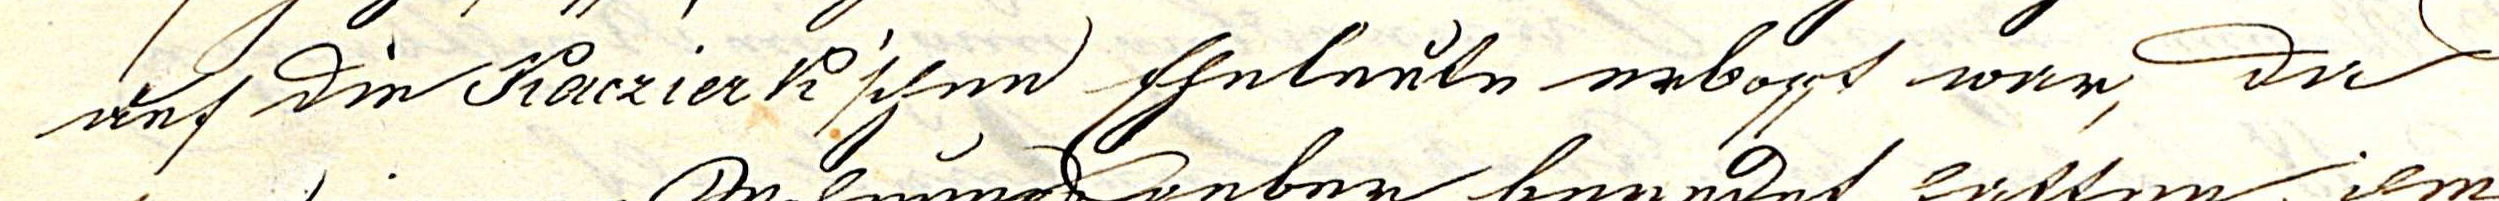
auf die Kaczierk’schen Eheleute erbosst war, da
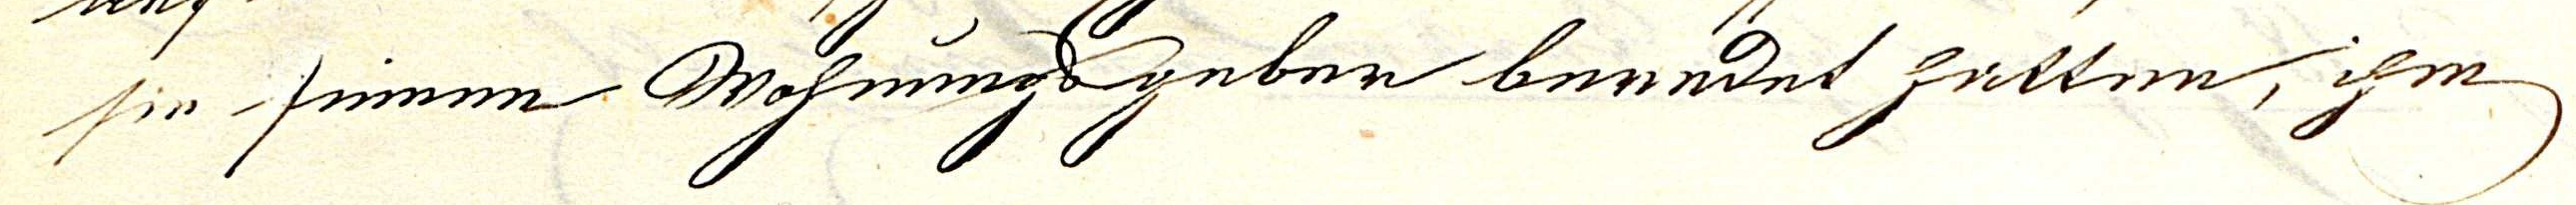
sie seinen Wohnungsgeber beredet hatten, ihm
